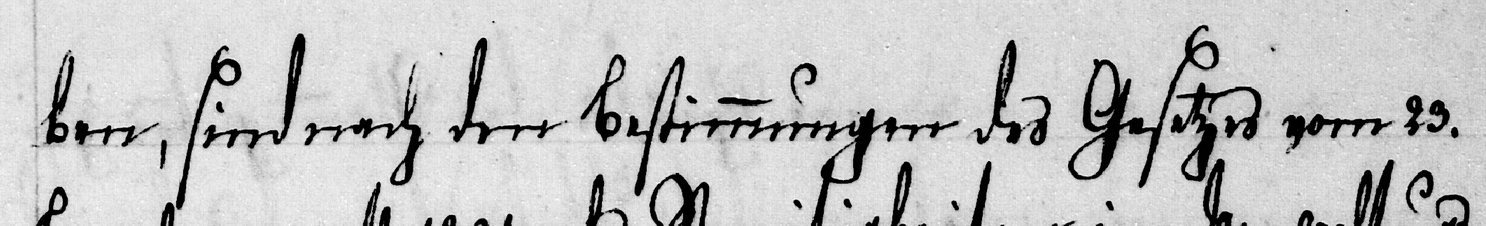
ben, sind nach den Bestimmungen des Gesetzes vom 23.
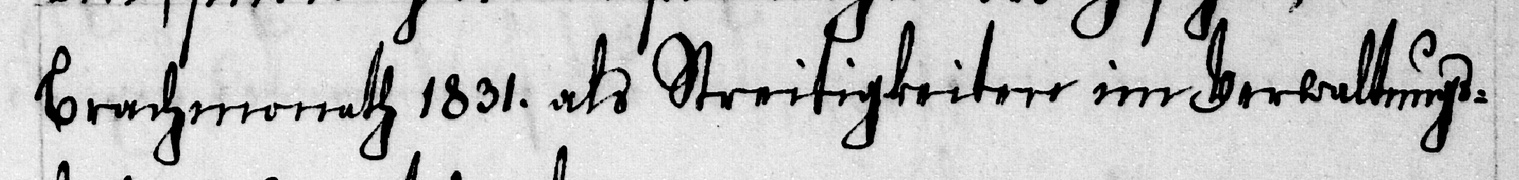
Brachmonath 1831. als Streitigkeiten im Verwaltungs¬
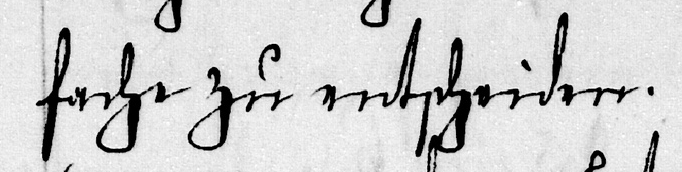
fache zu entscheiden.
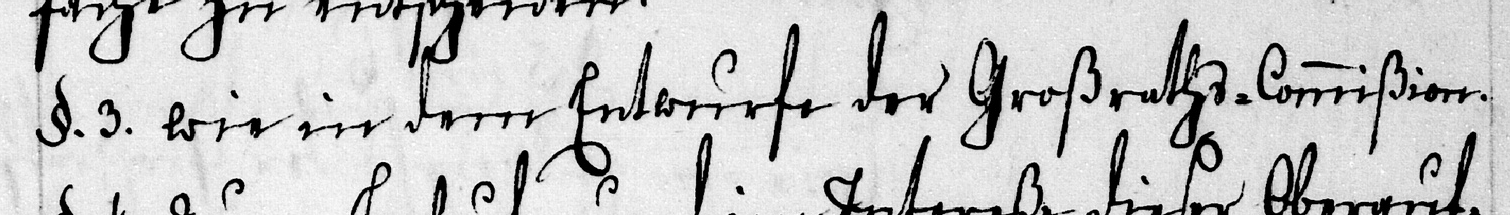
§. 3. wie in dem Entwurfe der Großraths-Commißion.
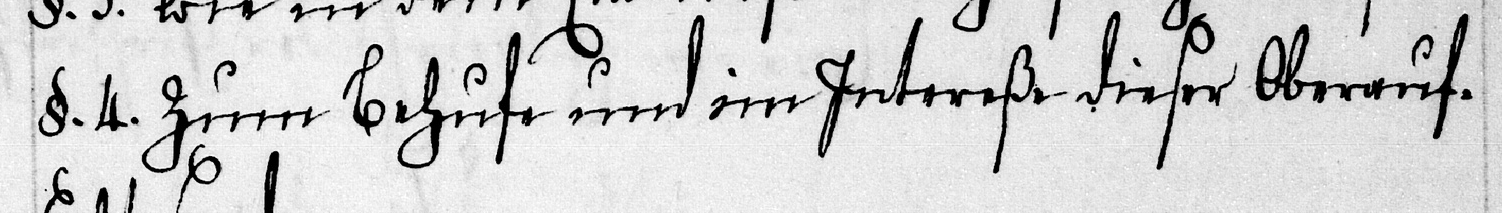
§. 4. Zum Behufe und im Intereße dieser Oberauf¬
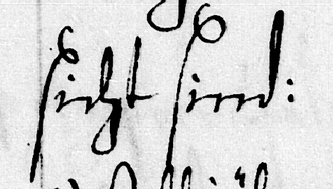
sicht sind:
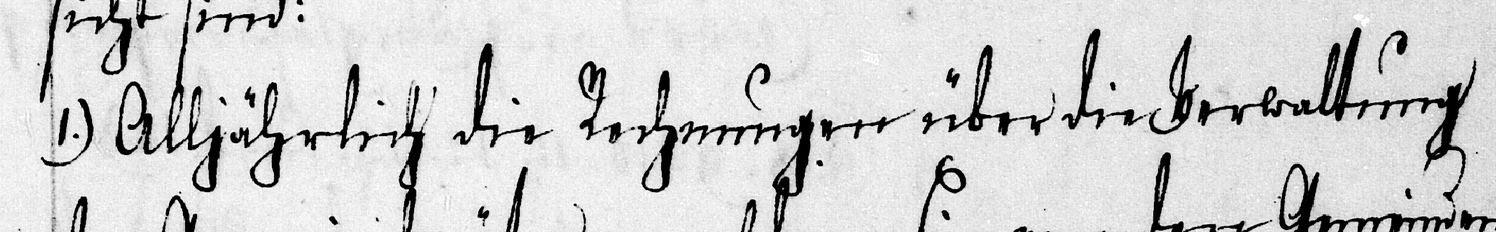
1.) Alljährlich die Rechnungen über die Verwaltung
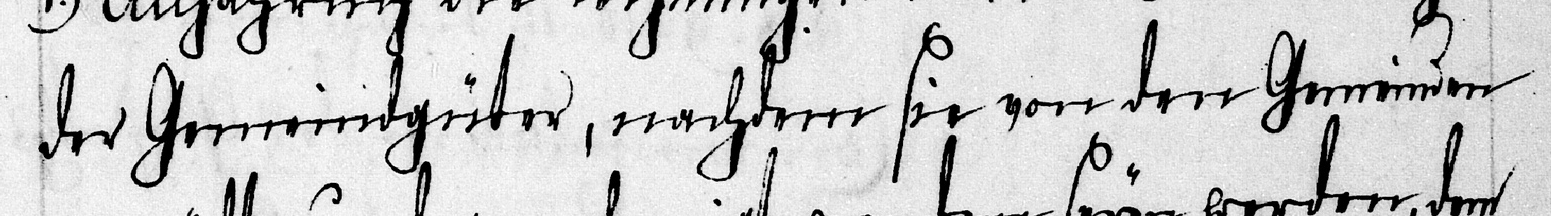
der Gemeindgüter, nachdem sie von den Gemeinden
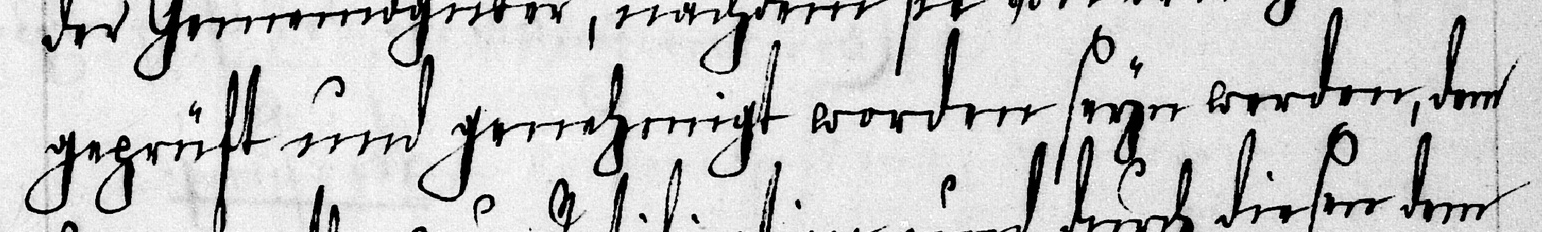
geprüft und genehmigt worden seyn werden, dem
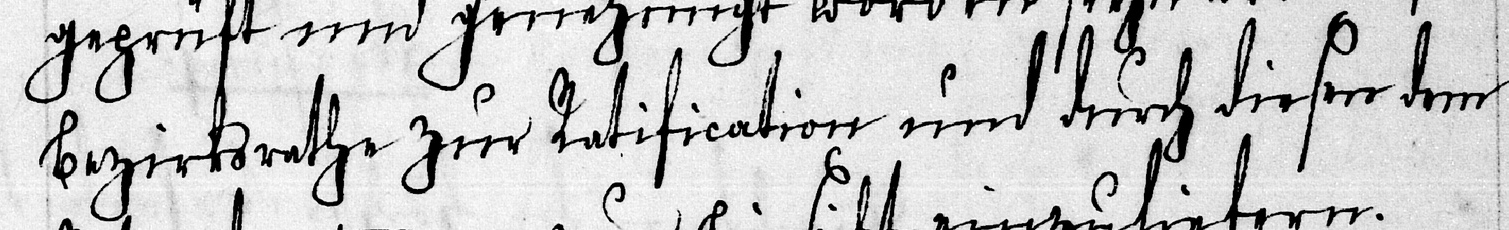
Bezirksrathe zur Ratification und durch diesen dem
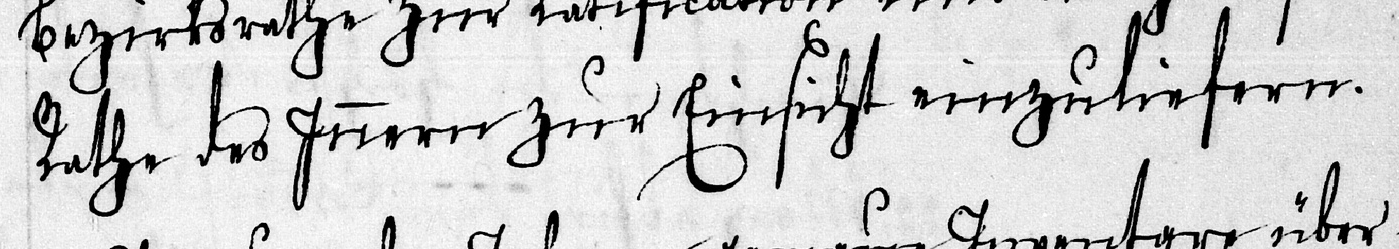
Rathe des Innern zur Einsicht einzuliefern.
